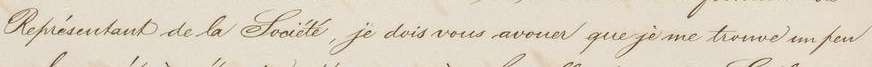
Représentant de la Société, je dois vous avouer que je me trouve un peu
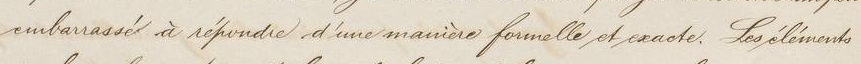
embarrassé à répondre d'une manière formelle et exacte. Les éléments
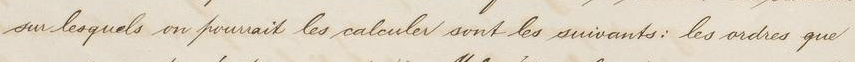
sur lesquels on pourrait les calculer sont les suivants: les ordres que
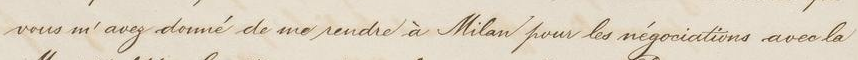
vous m'avez donné de me rendre à Milan pour les négociations avec la
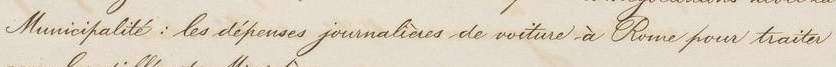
Municipalité: les dépenses journalières de voiture à Rome pour traiter
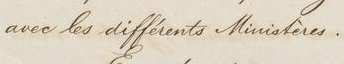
avec les différents Ministères.
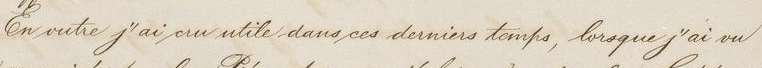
En outre j'ai cru utile dans ces derniers temps, lorsque j'ai vu
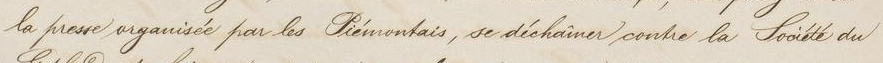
la presse organisée par les Piémontais, se déchaîner contre la Société du
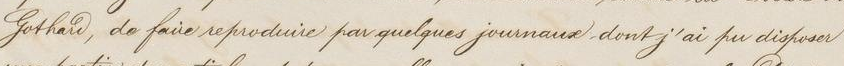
Gothard, de faire reproduire par quelques journaux dont j'ai pu disposer
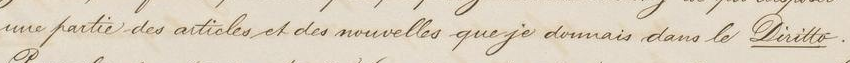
une partie des articles et des nouvelles que je donnais dans le Diritto.
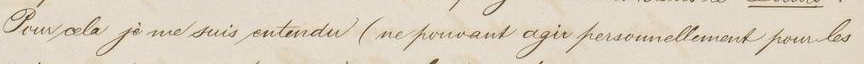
Pour cela je me suis entendu (ne pouvant agir personnellement pour les
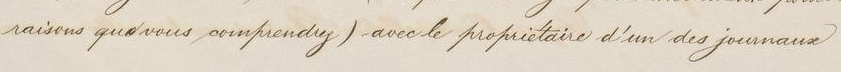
raisons que vous comprendrez) avec le propriétaire d'un des journaux
